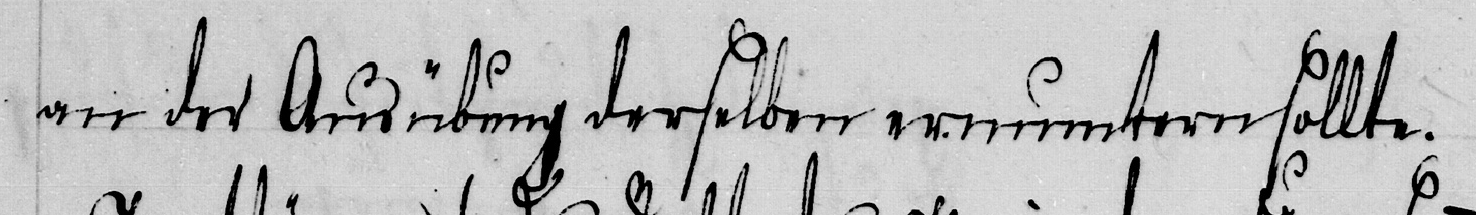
an der Ausübung derselben ermuntern sollte.
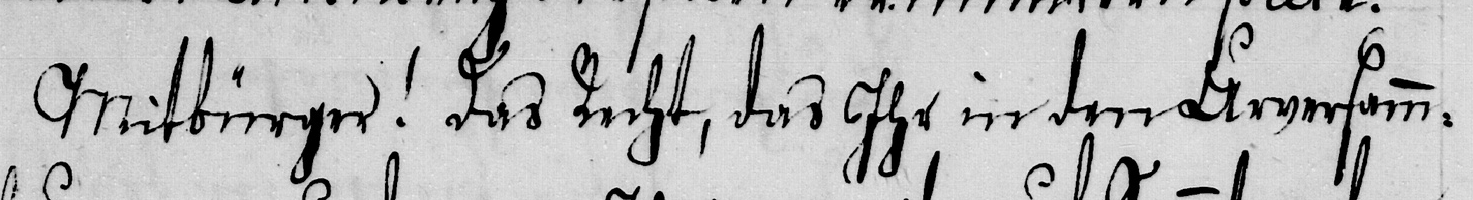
Mitbürger! Das Recht, das Ihr in den Urversamm¬
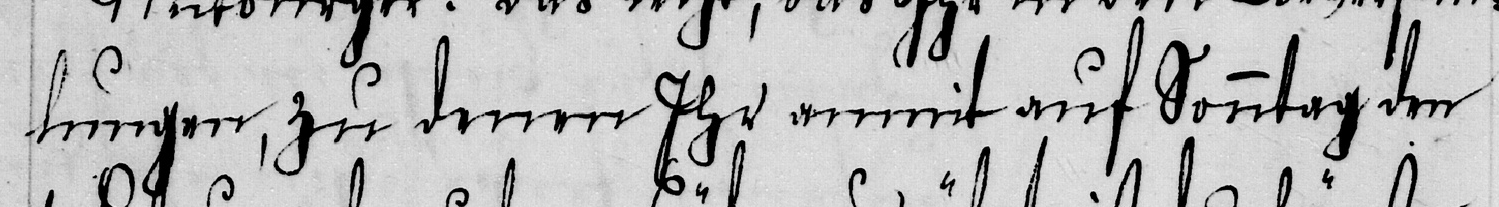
lungen, zu denen Ihr anmit auf Sonntag den
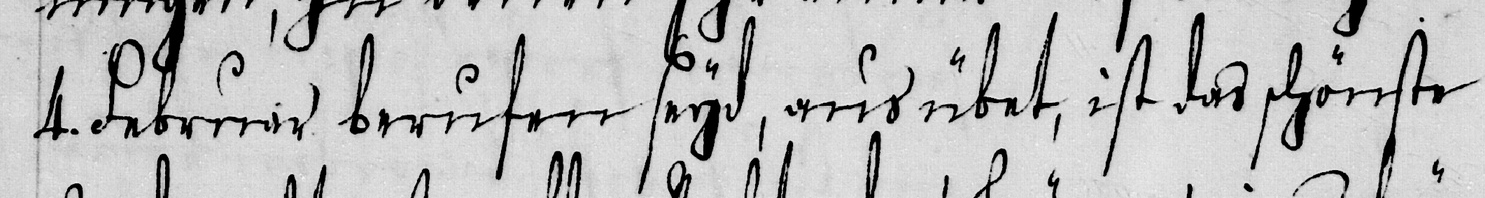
4. Februar berufen seyd, ausübet, ist das schönste
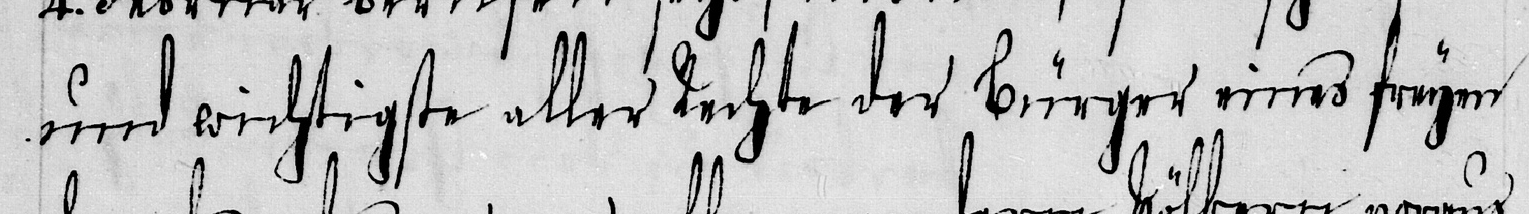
und wichtigste aller Rechte der Bürger eines freyen
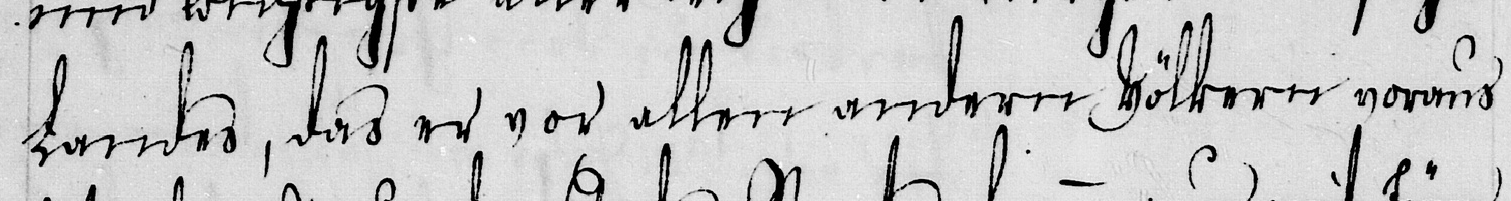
Landes, das er vor allen andern Völkern voraus
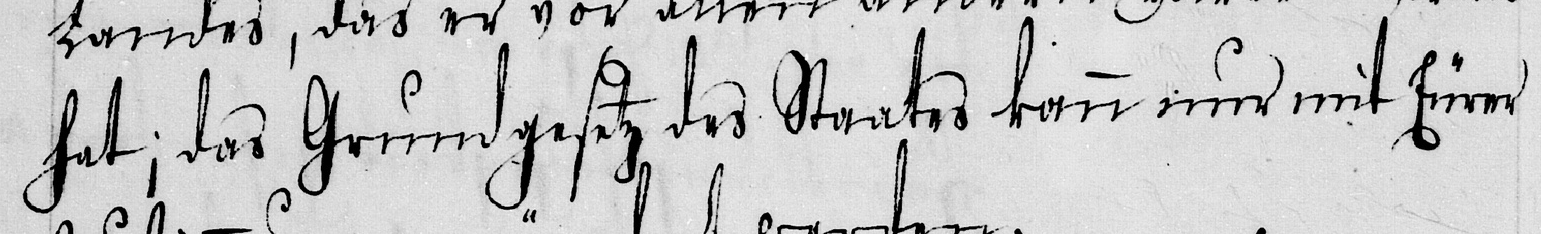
hat; das Grundgesetz des Staates kann nur mit Eurer
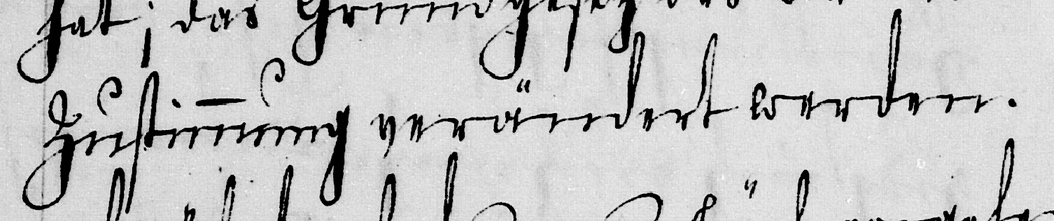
Zustimmung verändert werden.
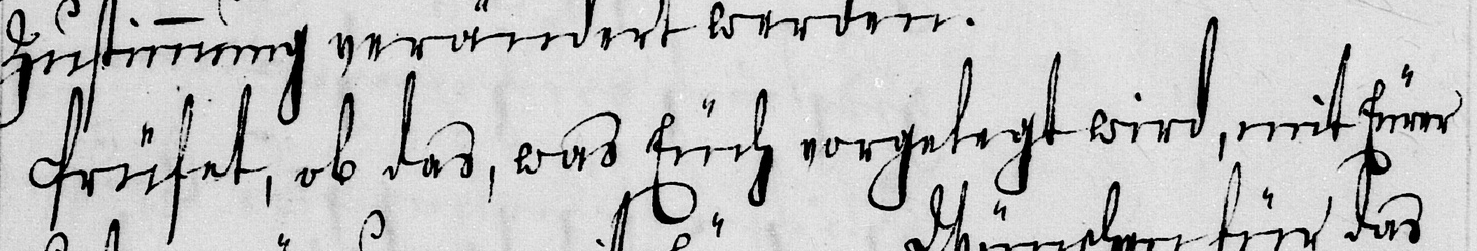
Prüfet, ob das, was Euch vorgelegt wird, mit Eurer
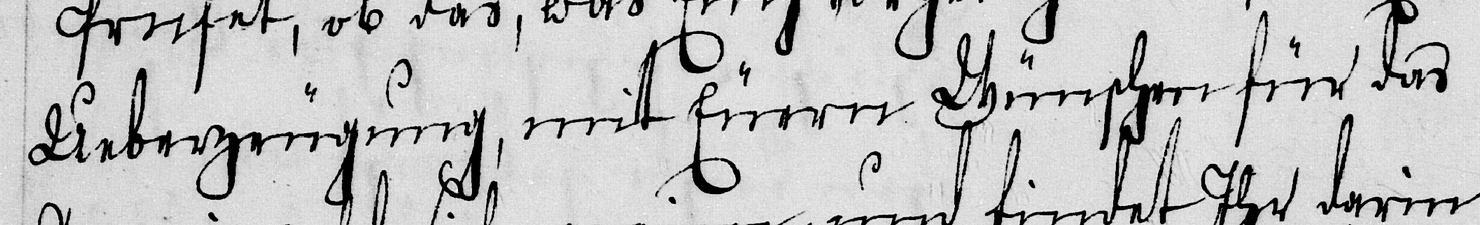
Ueberzeugung, mit Euern Wünschen für das
